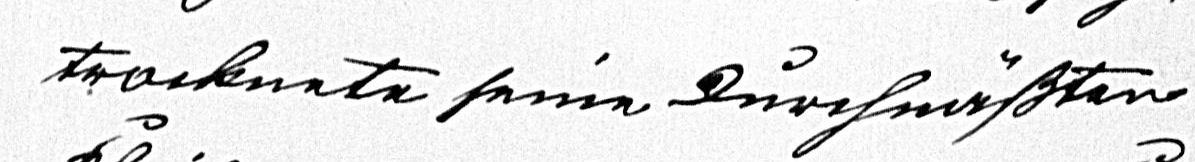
trocknete seine Durchnäßten
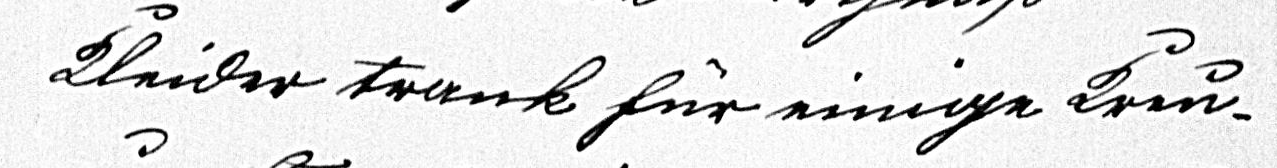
Kleider trank für einige Kreu¬
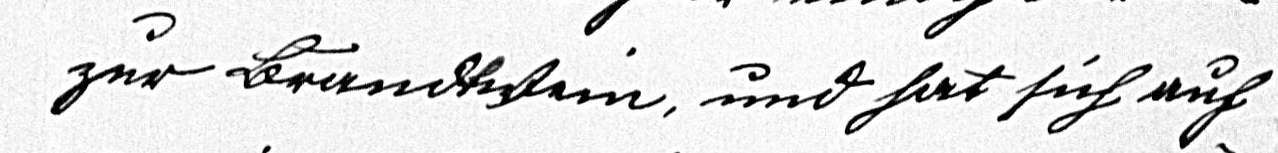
zur Brandtwein, und hat sich auf
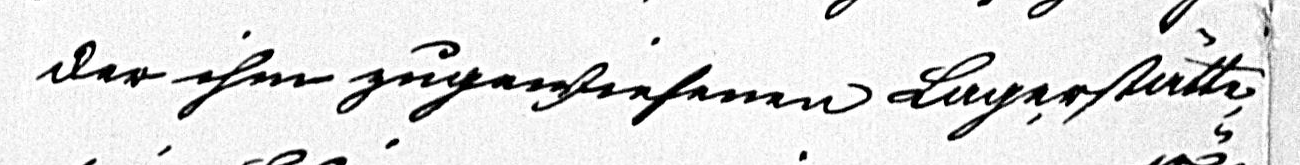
der ihm zugewiesenen Lagerstätte
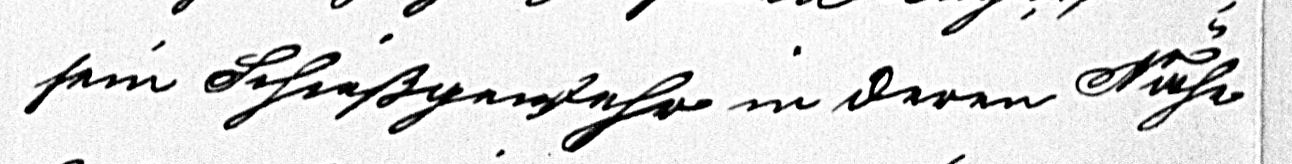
sein Schießgewehr in deren Nahe¬
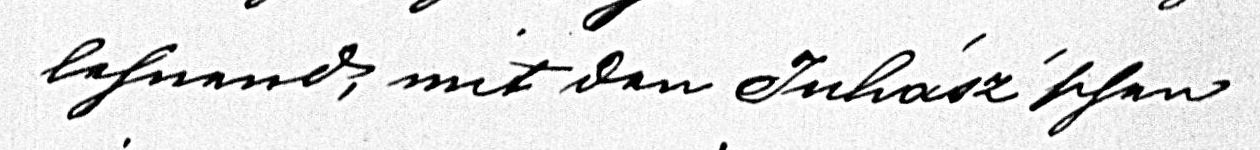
lehnend, mit den Juhász'schen
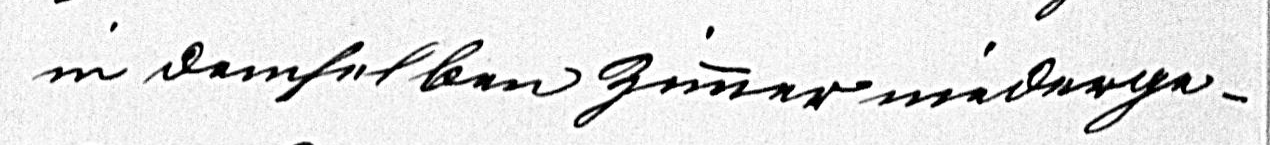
in demselben Zimmer niederge¬
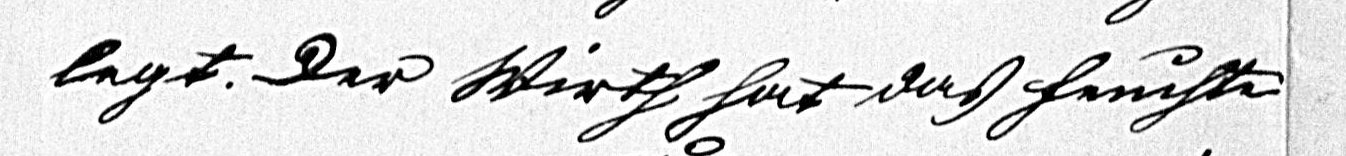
legt. Der Wirth hat das feuchte
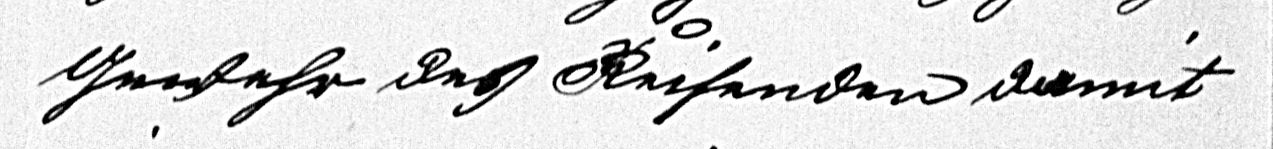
Gewehr des Reisenden damit
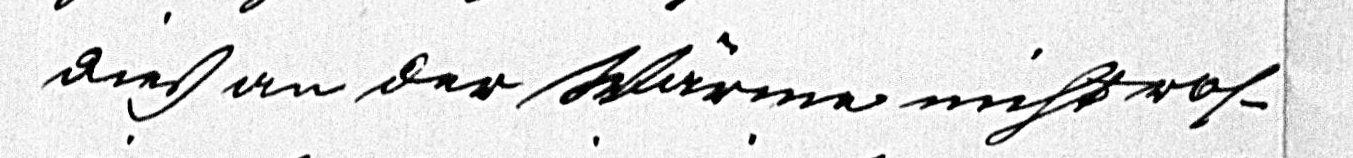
dies an der Wärme nicht ros¬
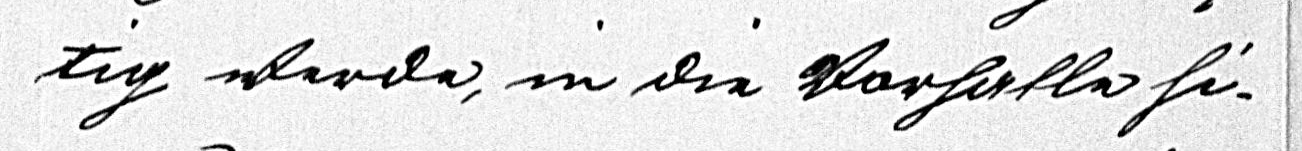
tig werde, in die Vorhalle hi¬
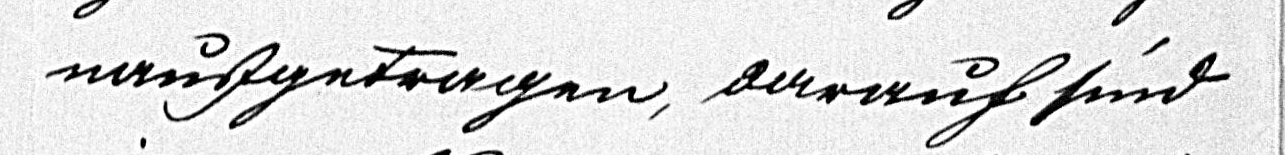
nausgetragen, darauf sind
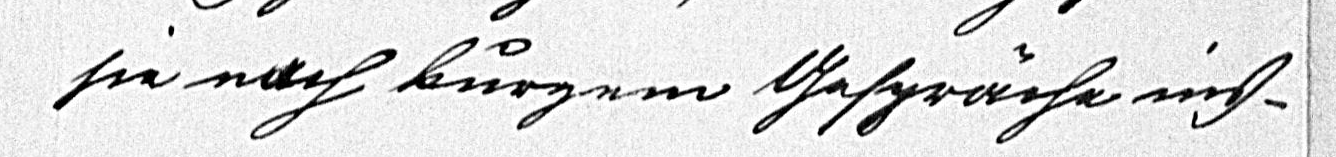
sie nach kurzem Gespräche ins¬
